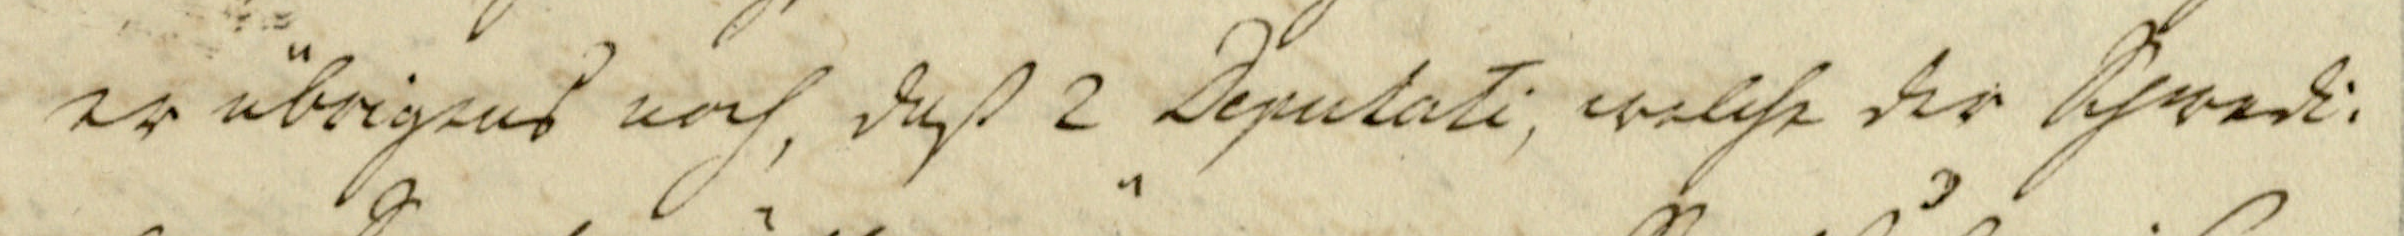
er übrigens noch, daß 2 Deputati, welche der Schwedi¬
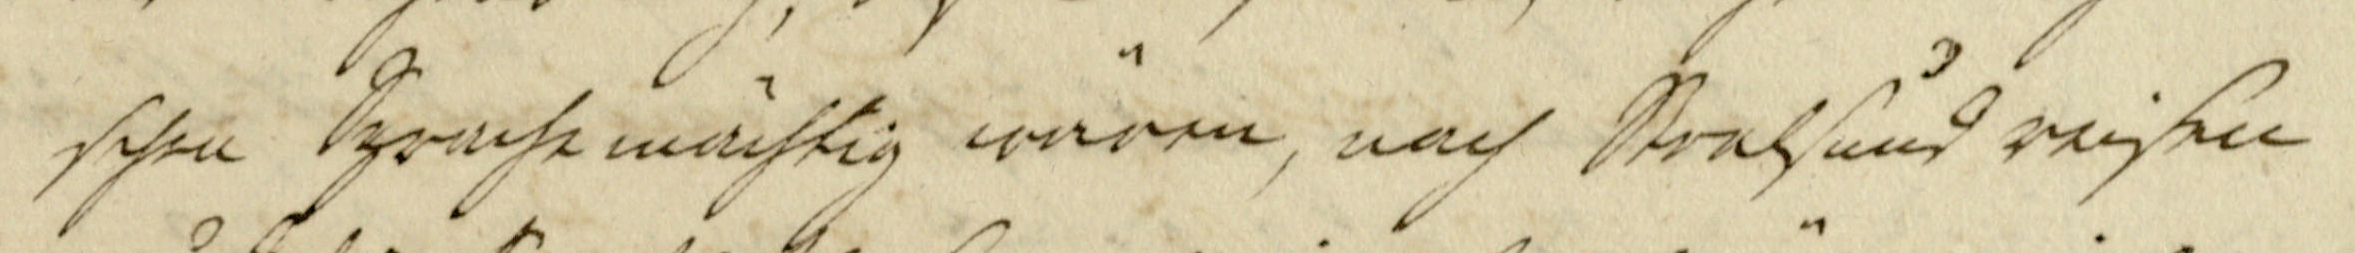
schen Sprache mächtig wären, nach Stralsund reisen
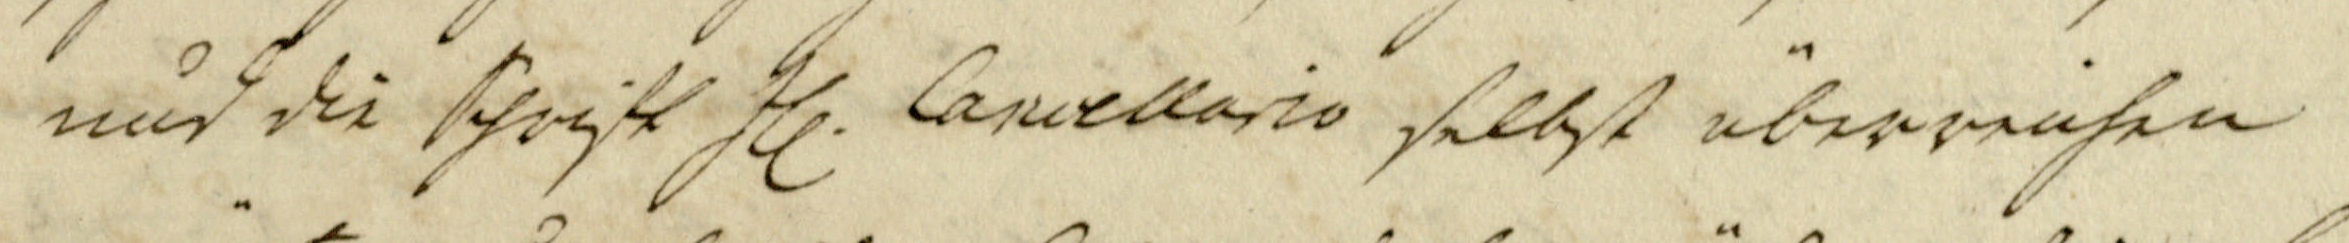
und die Schrift Ill. Cancellario selbst überreichen
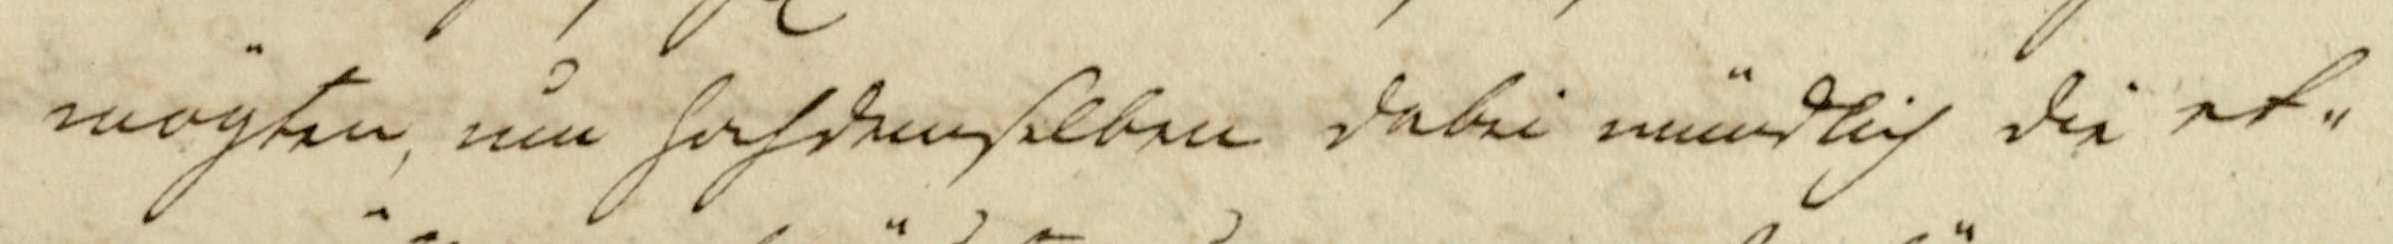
mögten, um Hochdemselben dabei mündlich die et¬
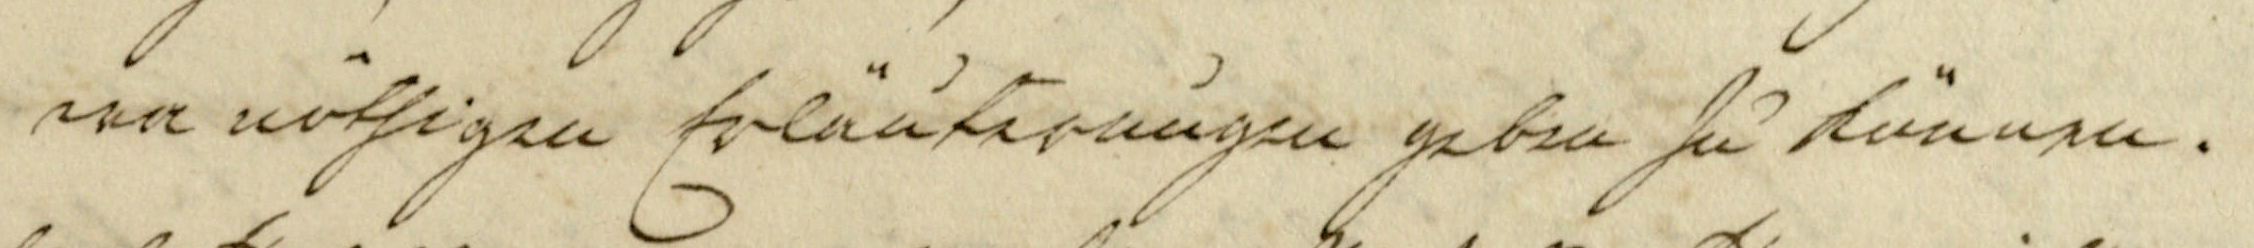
wa nöthigen Erläuterungen geben zu können.
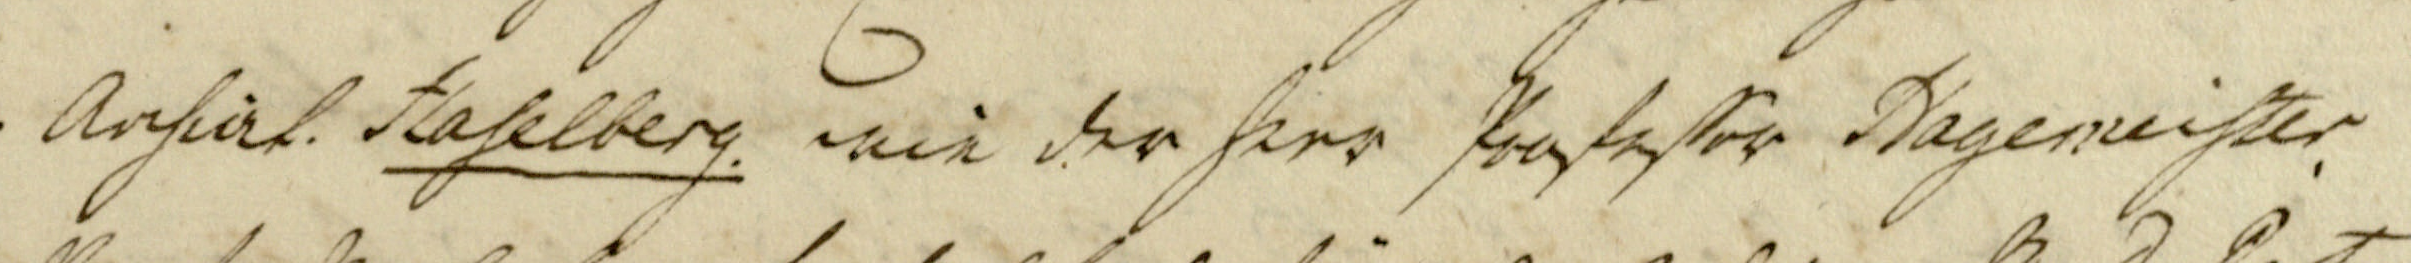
Archiat. Haselberg. wie der Herr Professor Hagemeister.
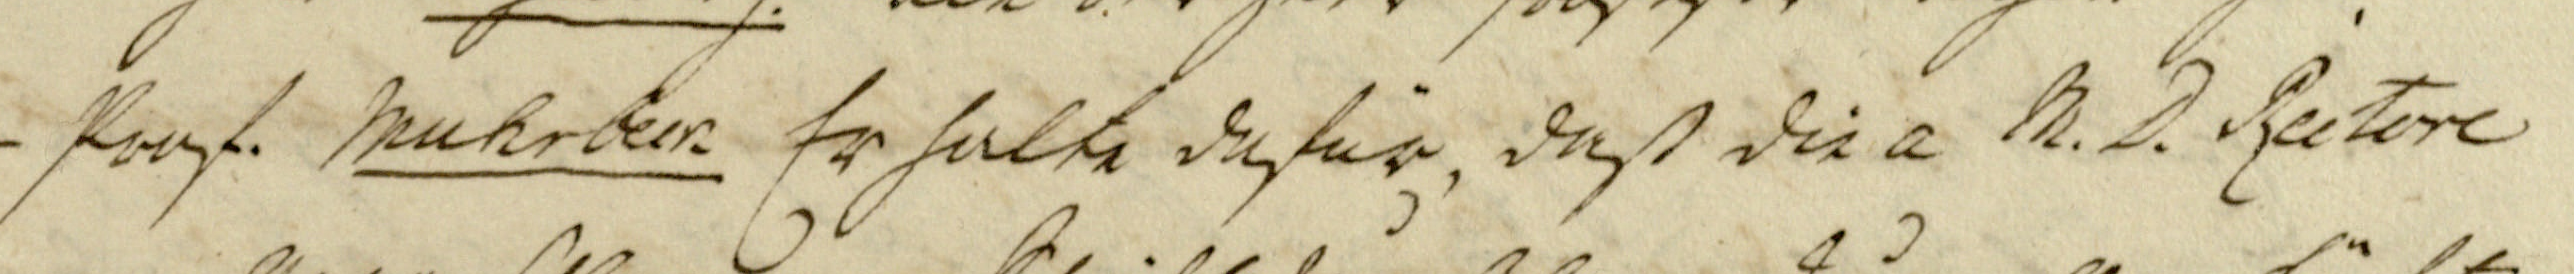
Prof. Muhrbeck. Er halte dafür, daß die a M. D. Rectore
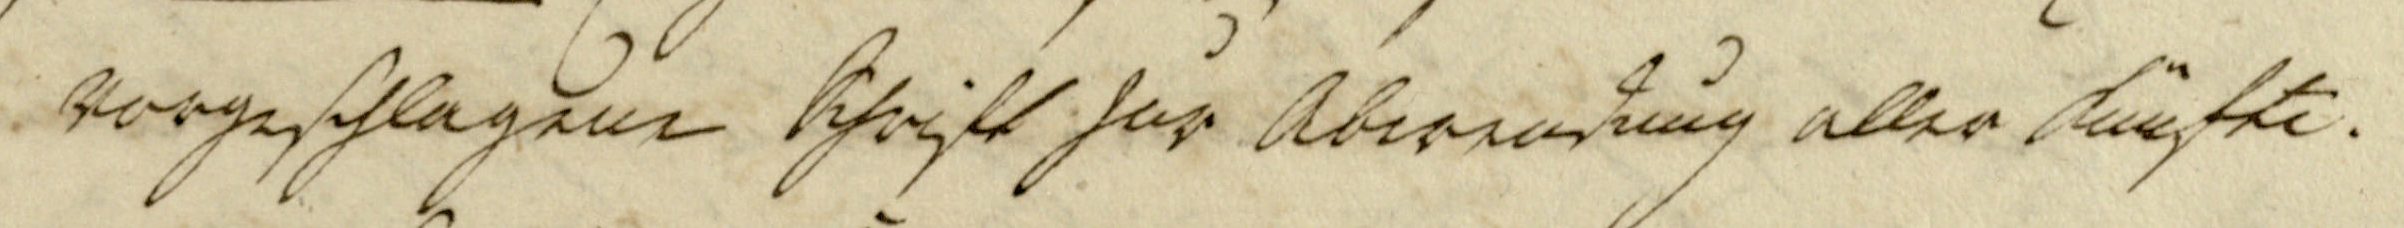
vorgeschlagene Schrift zur Abwendung aller künfti¬
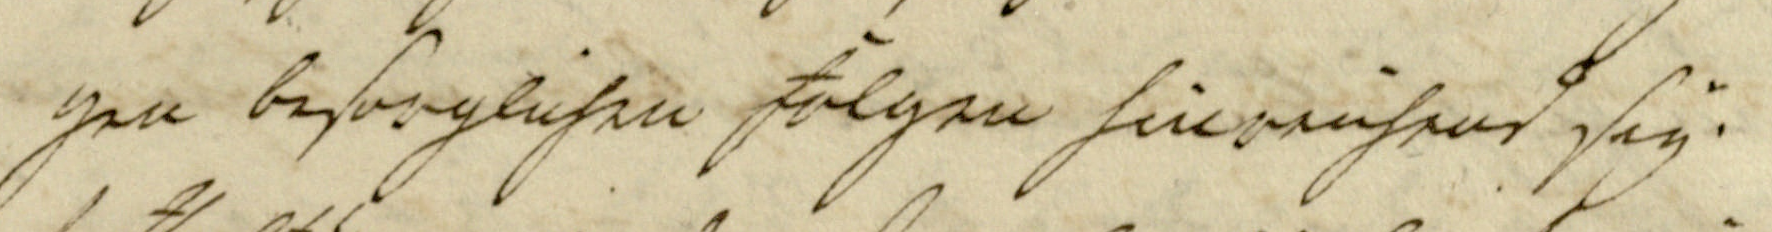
gen besorglichen Folgen hinreichend seÿ.
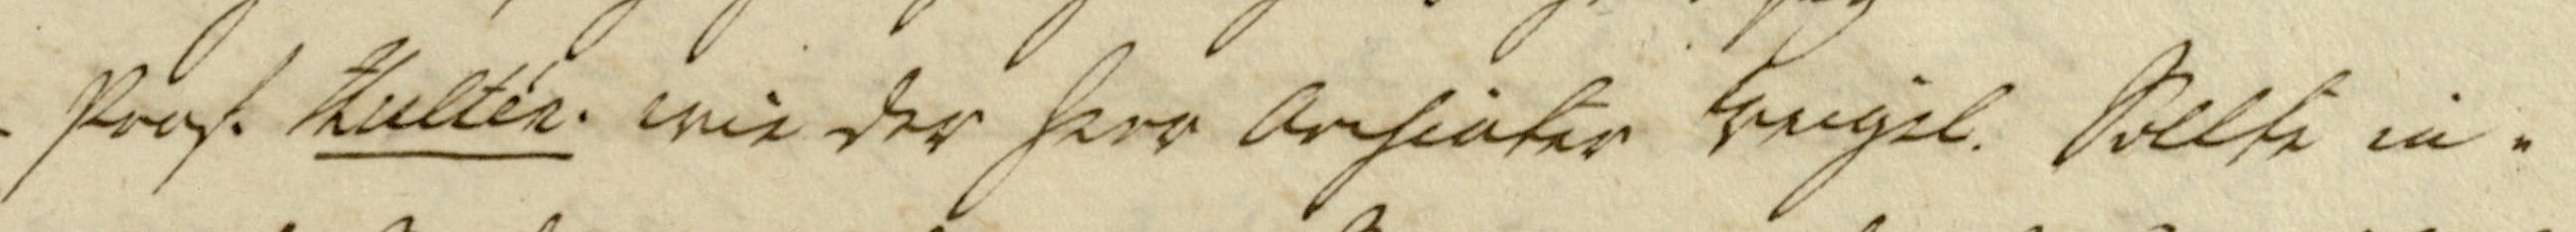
Prof. Hultén. wie der Herr Archiater Weigel. Sollte in¬
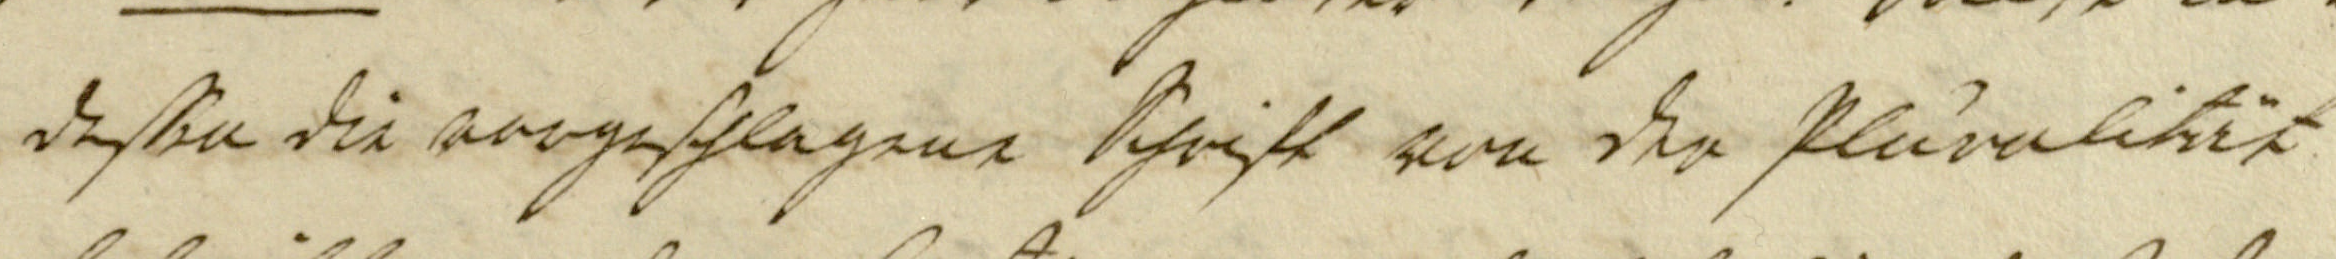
dessen die vorgeschlagene Schrift von der Pluralität
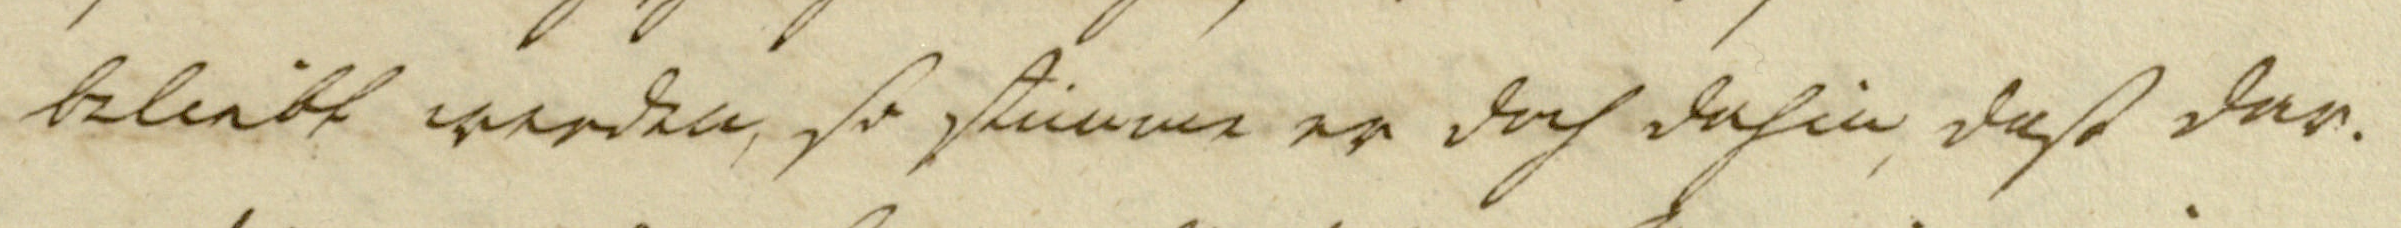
beliebt werden, so stimme er doch dahin, daß dar¬
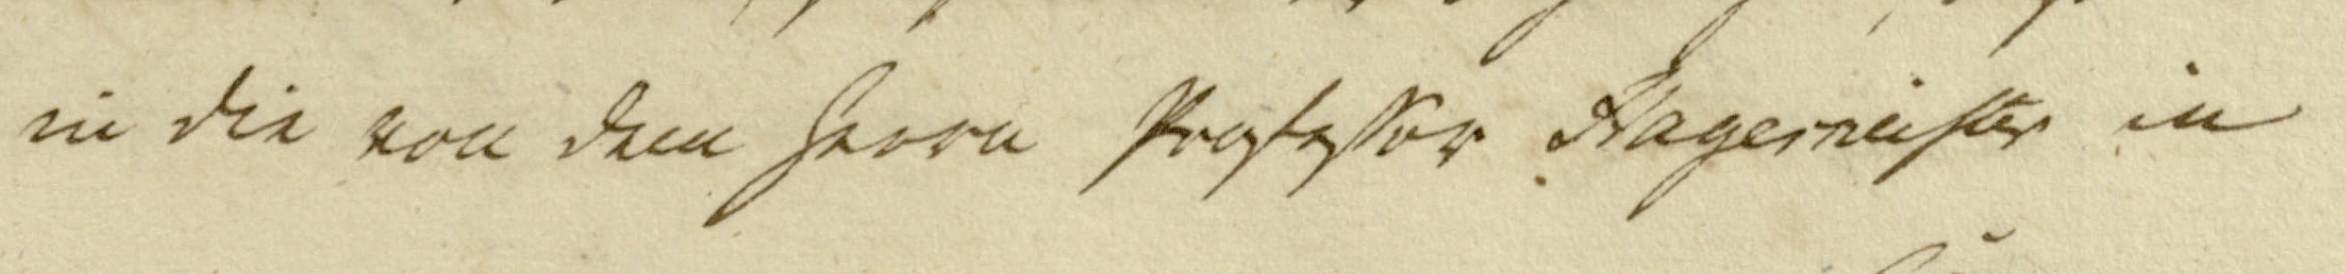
in die von dem Herrn Professor Hagemeister in
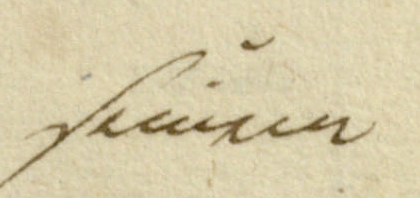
seinem
